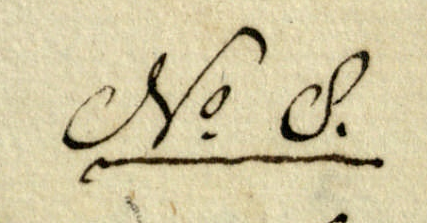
No 8.
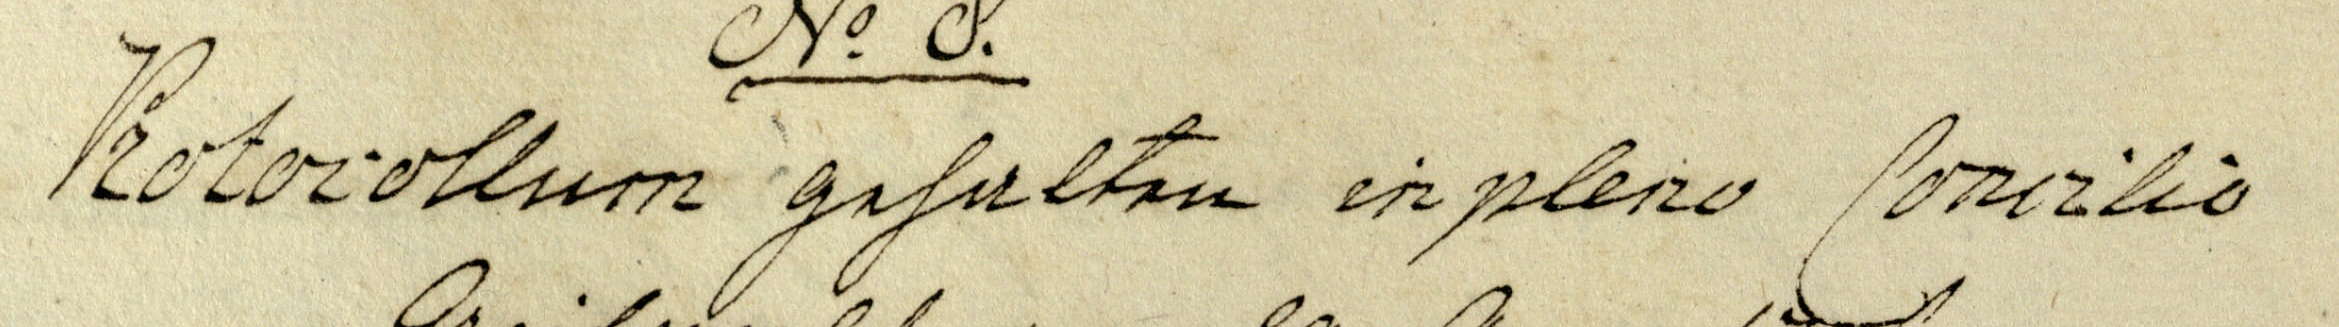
Protocollum gehalten in pleno Concilio
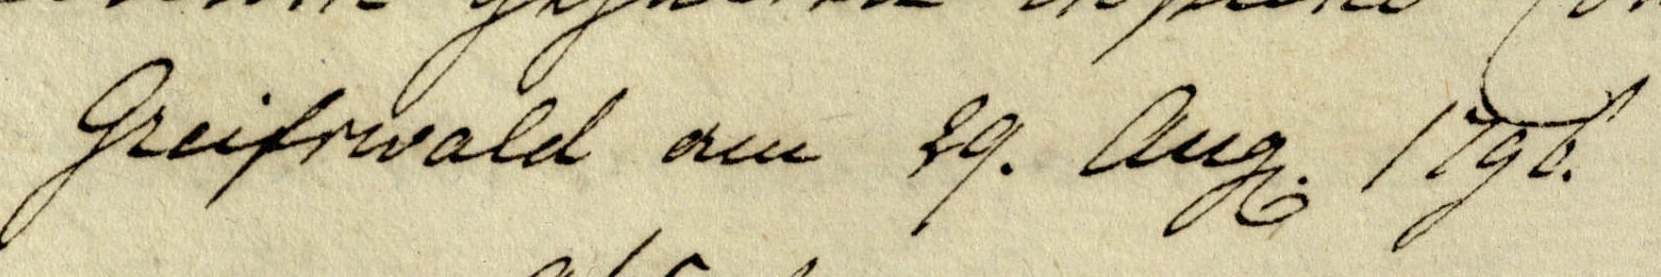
Greifswald am 29. Aug. 1796.
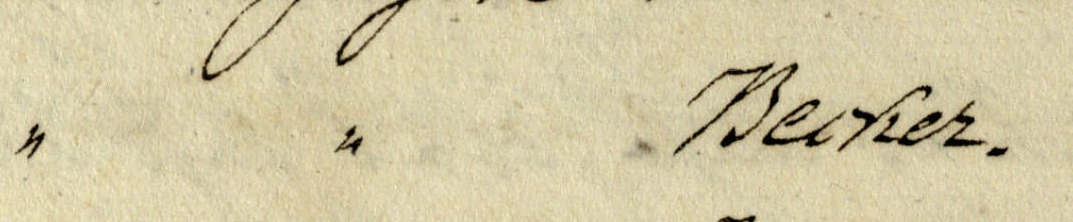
Becker.
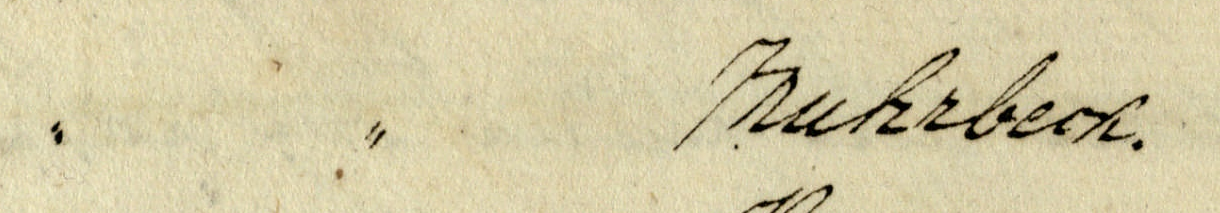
Muhrbeck.
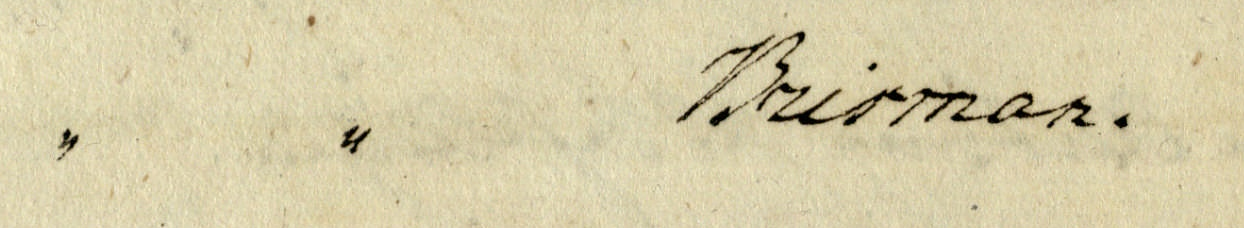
Brisman.
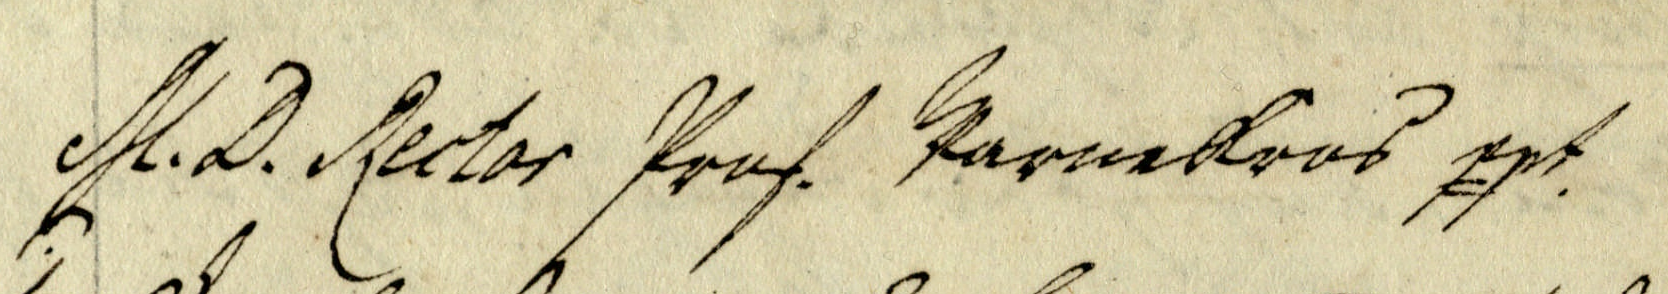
M. D. Rector Prof. Warnekros ppt.
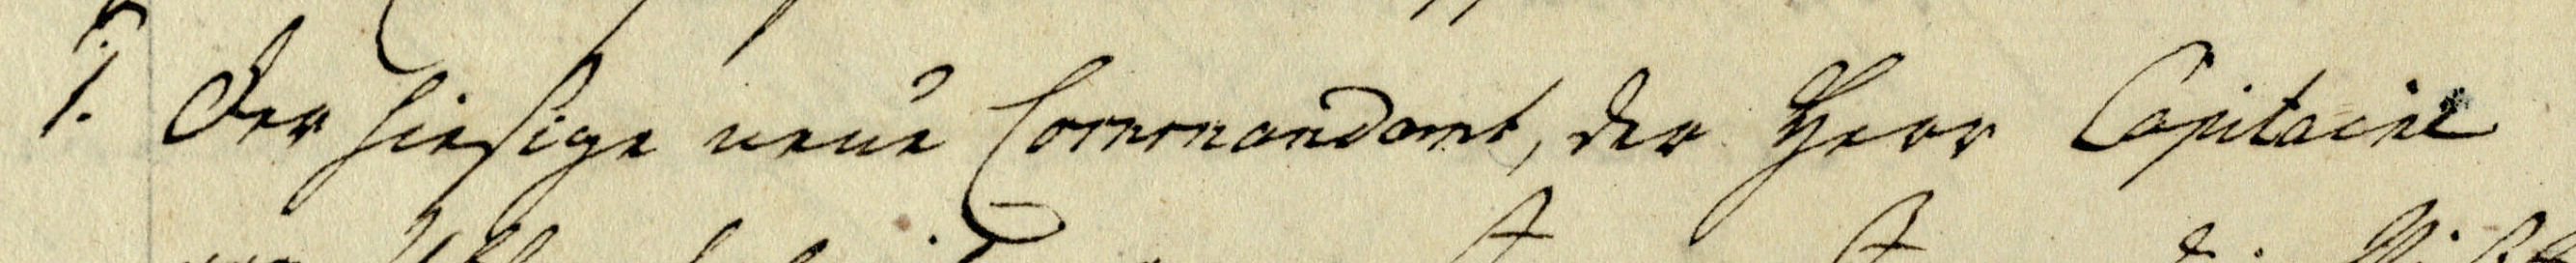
1. Der hiesige neue Commandant, der Herr Capitaine
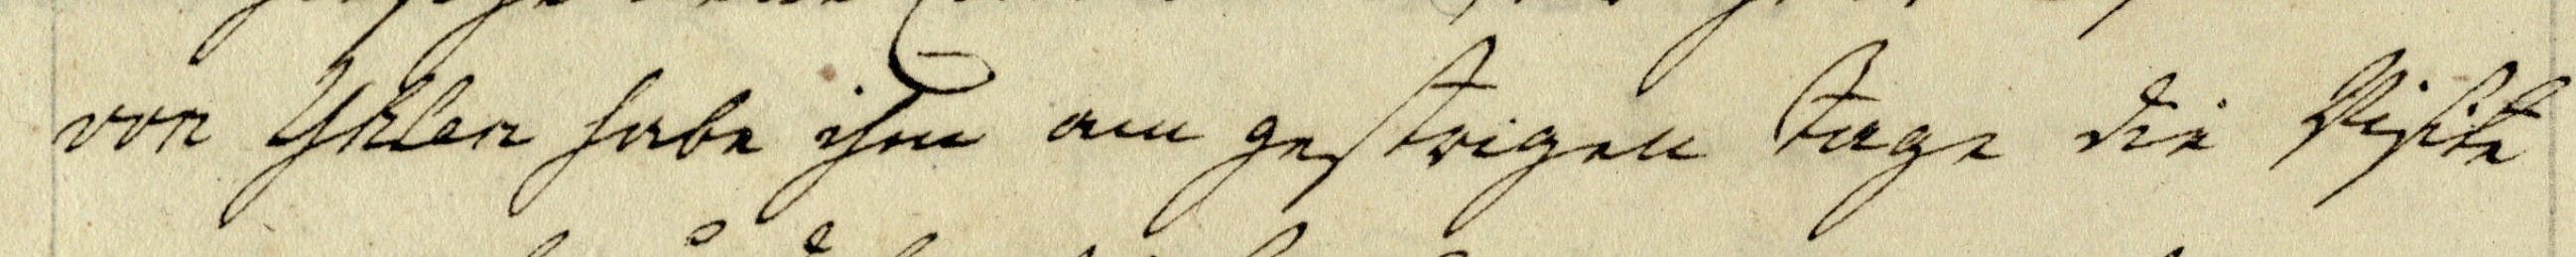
von Yhlen habe ihm am gestrigen Tage die Visite
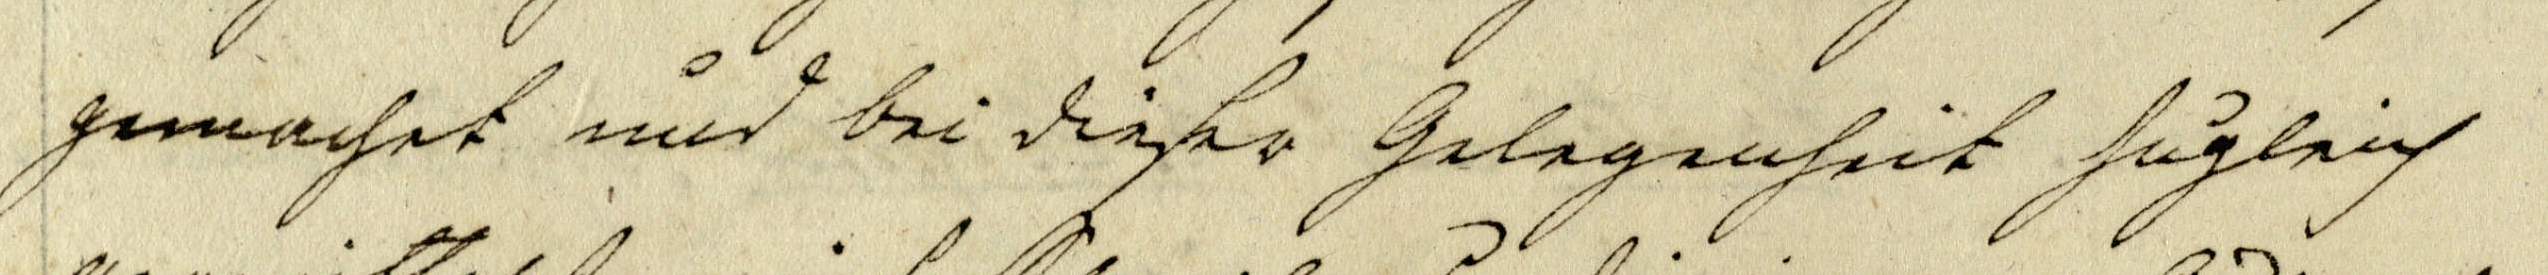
gemachet und bei dieser Gelegenheit zugleich
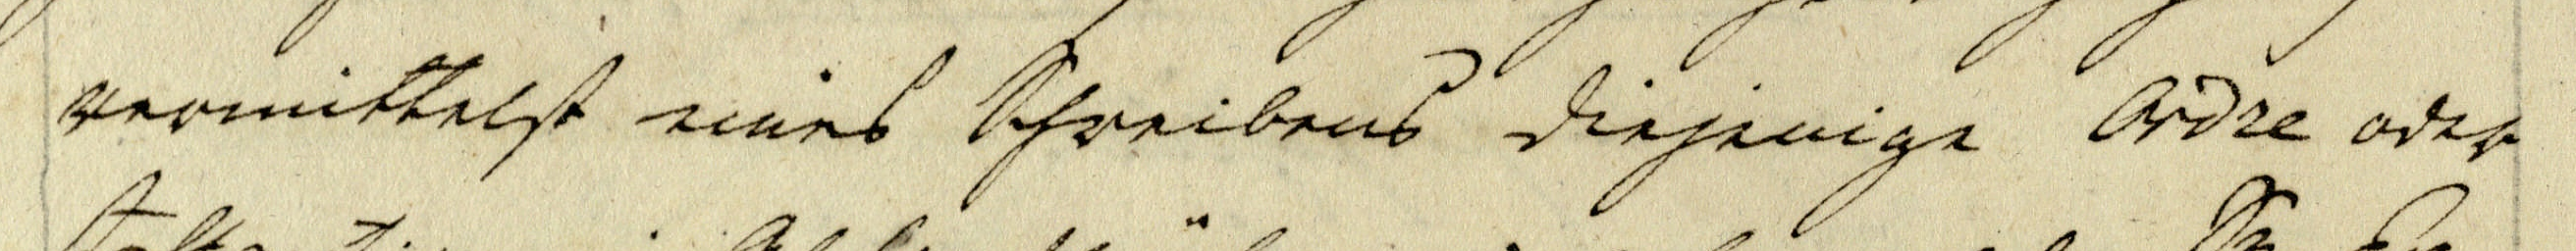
vermittelst eines Schreibens diejenige Ordre oder
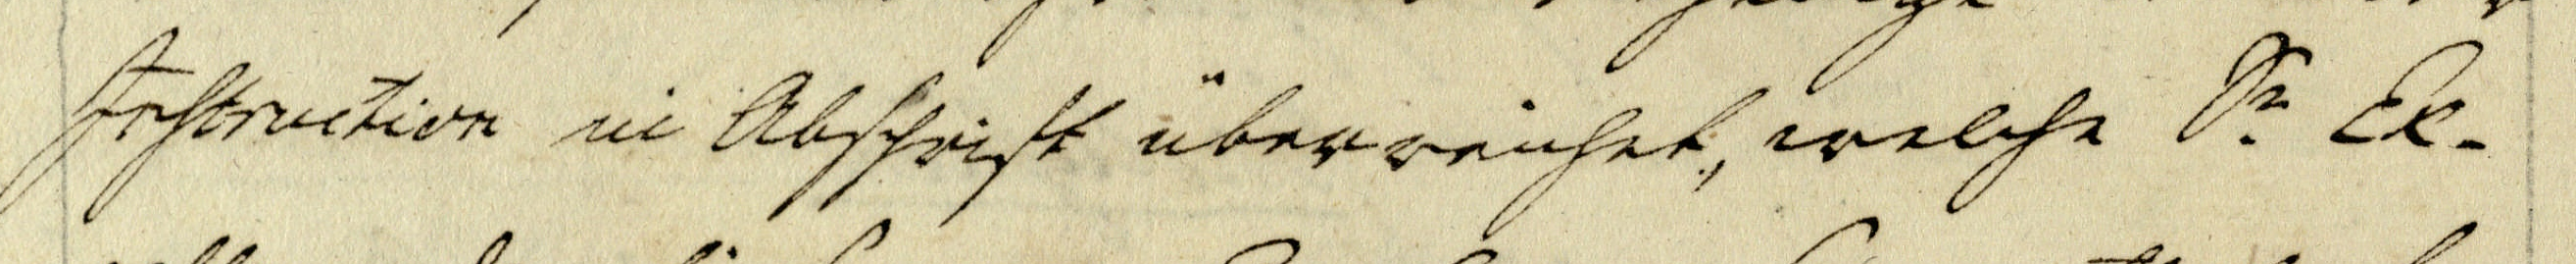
Instruction in Abschrift überreichet, welche Sr Ex¬
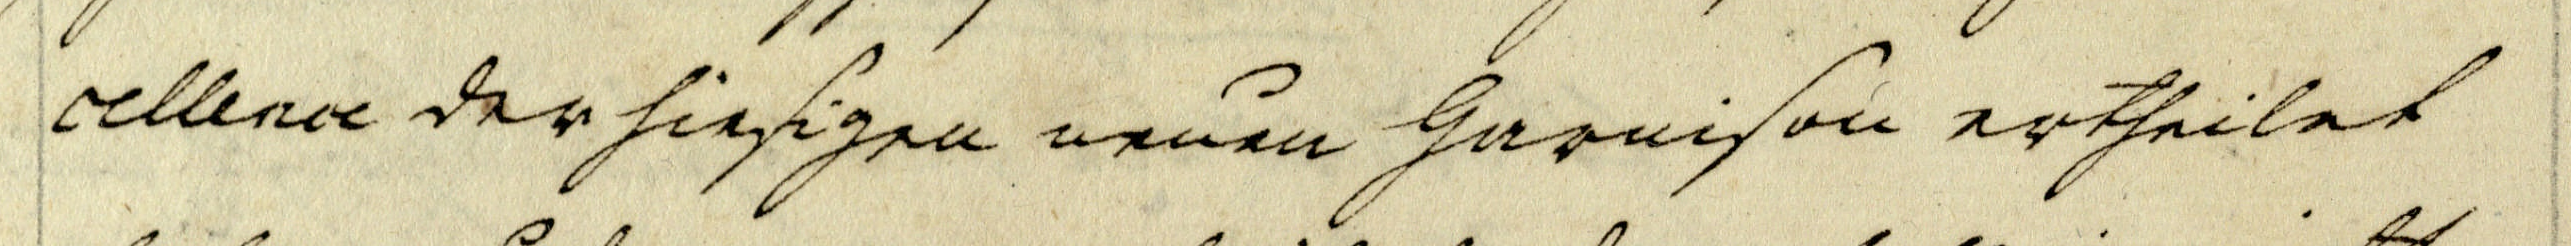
cellence der hiesigen neuen Garnison ertheilet
